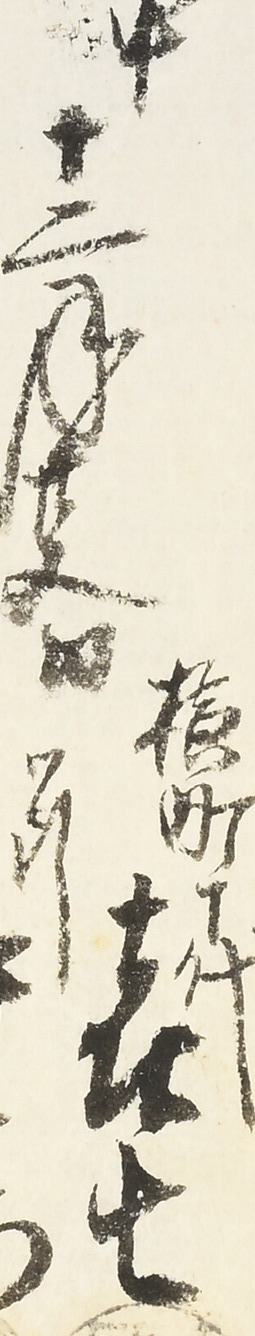十二月廿五日
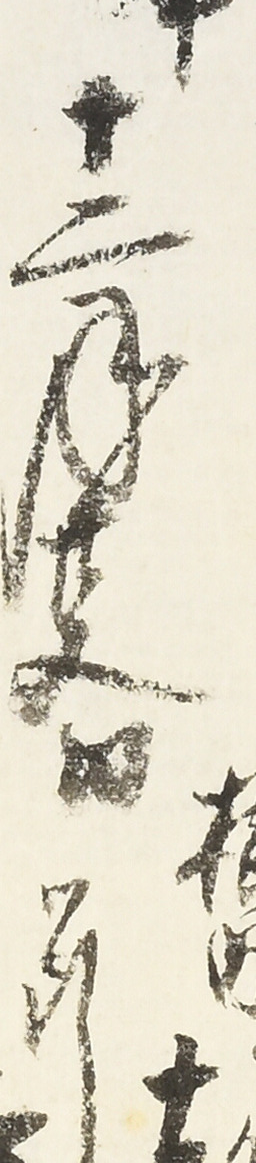十二月廿五日同断
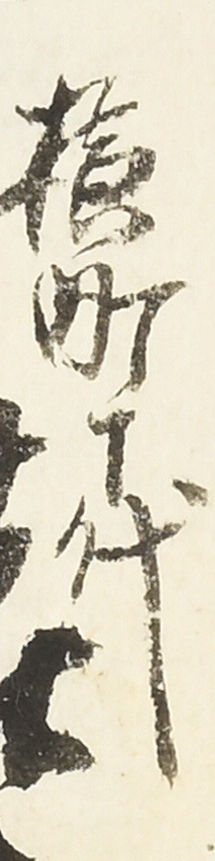横町丁代
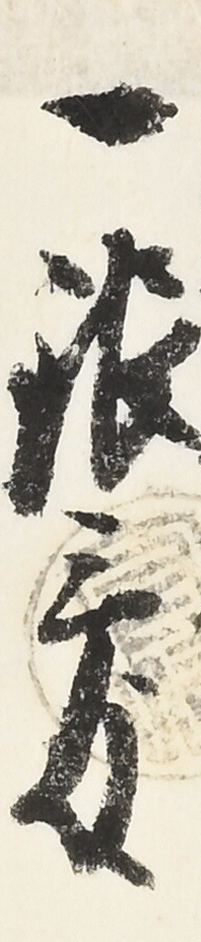一銀六匁
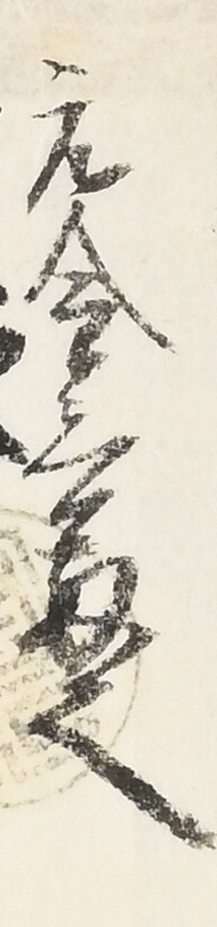元金三両也
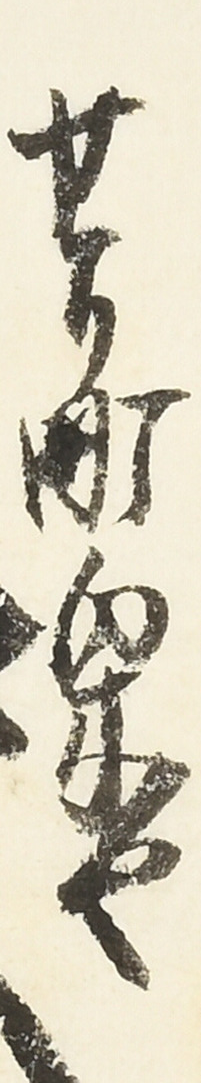せり町白木や
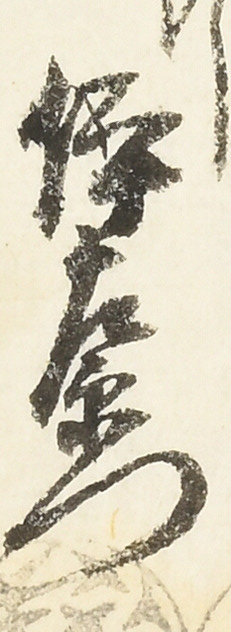伊左衛門
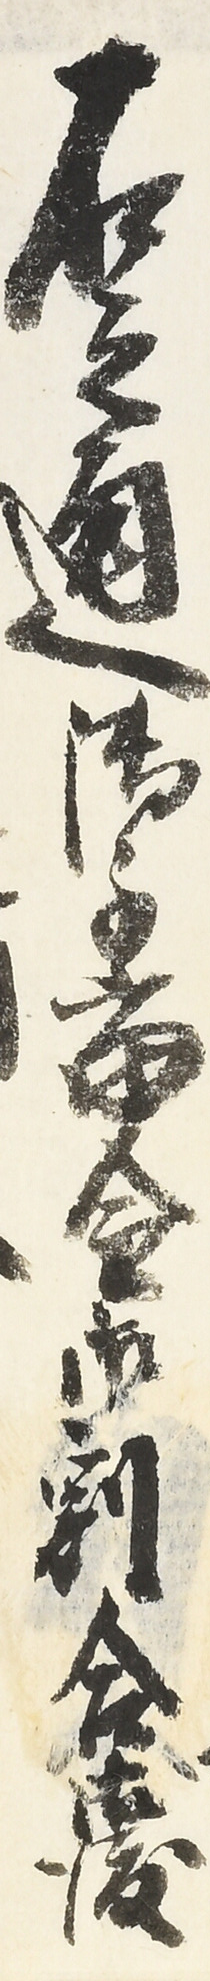右之通御手当金御割合御渡
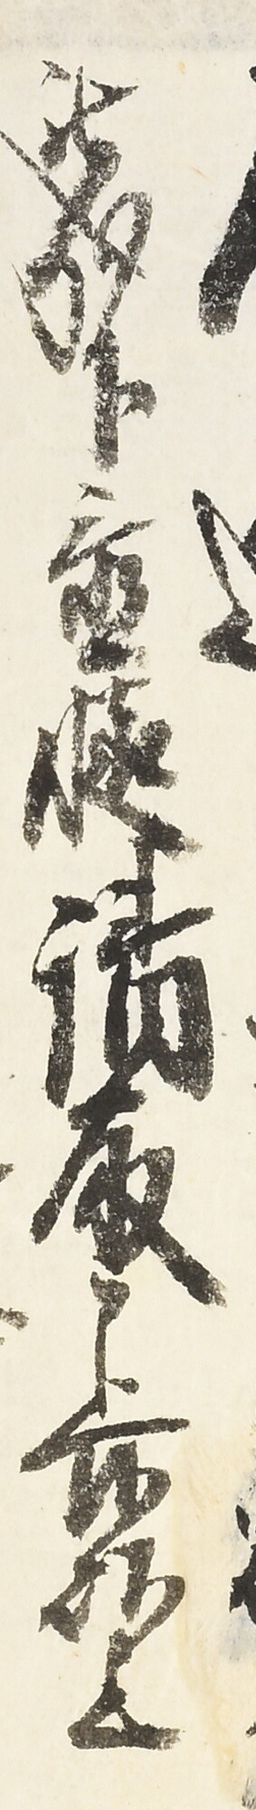被成下置慥請取申上候以上
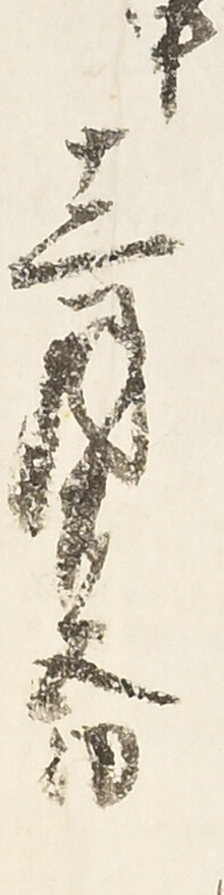十二月廿五日
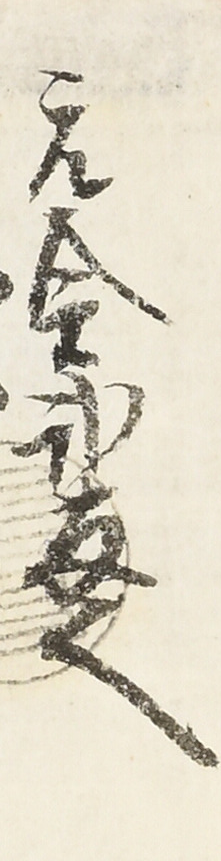元金三両也
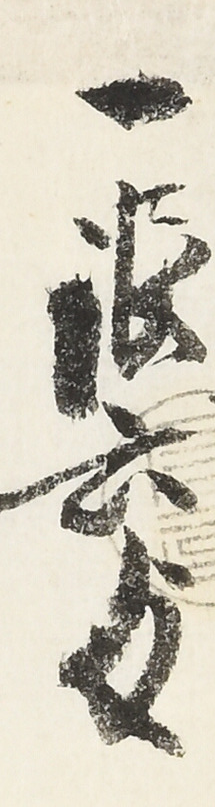一銀六匁
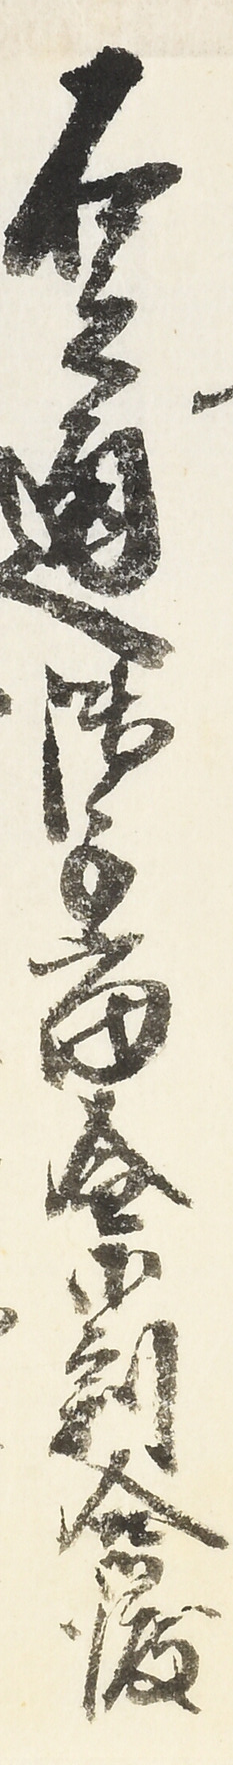右之通御手当金御割合御渡
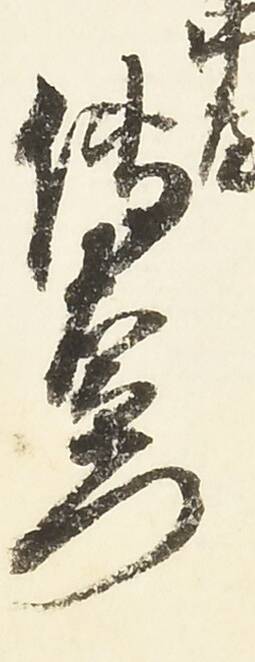伝右衛門
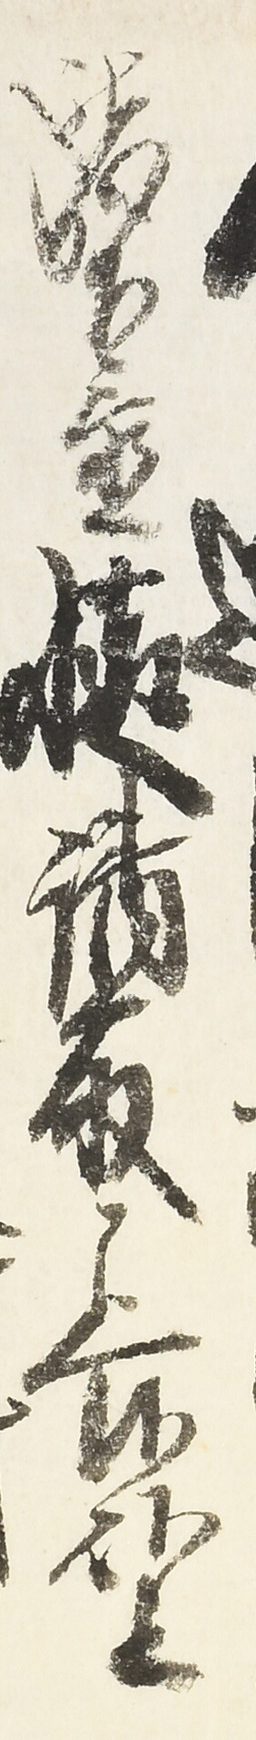被成下置慥請取申上候以上
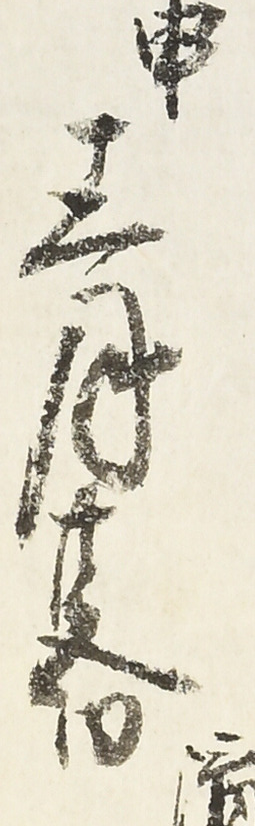十二月廿五日
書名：御才覚金御利足割渡扣帳
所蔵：伊那市立高遠町図書館・合同会社AMANE
